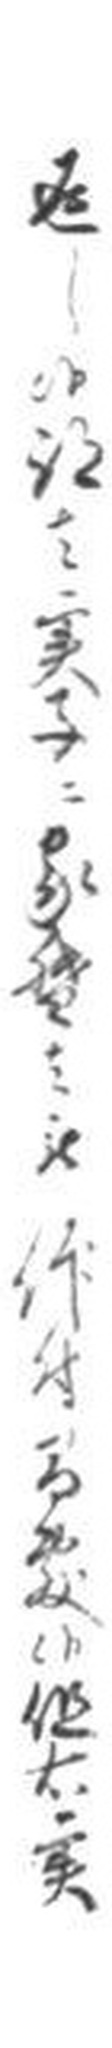返し候得者実子ニ家督者被仰付間敷候但右実
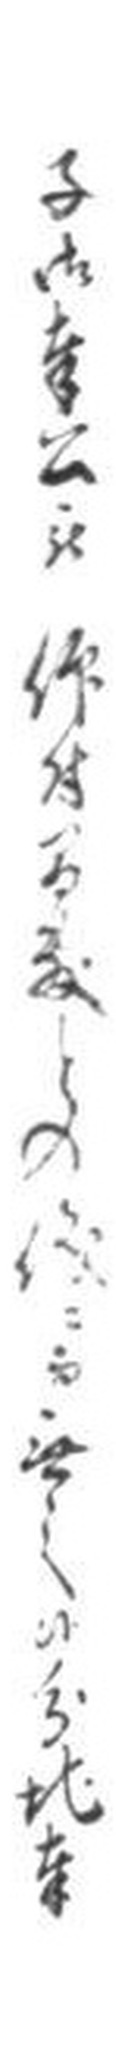子御奉公被仰付間敷との儀ニ而無之候分地奉
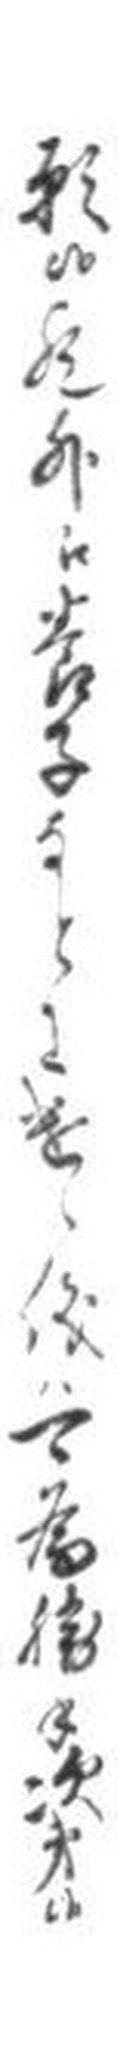願候歟外江養子なと遣候儀ハ可為勝手次第候
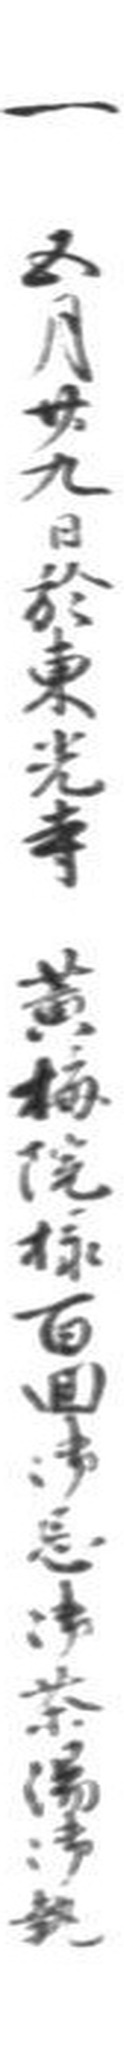一五月廿九日於東光寺黄梅院様百回御忌御茶湯御執
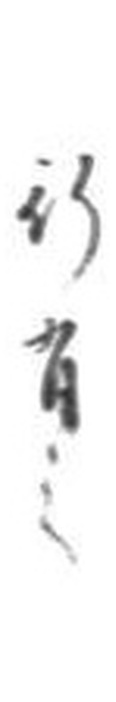行有之
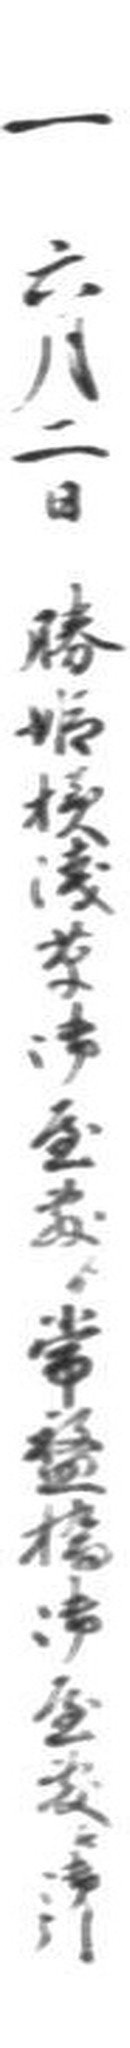一六月二日勝姫様浅草御屋敷ゟ常盤橋御屋敷江御引
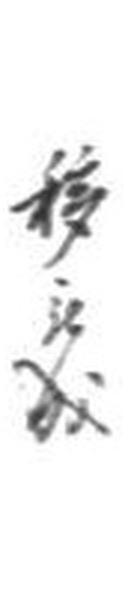移被成
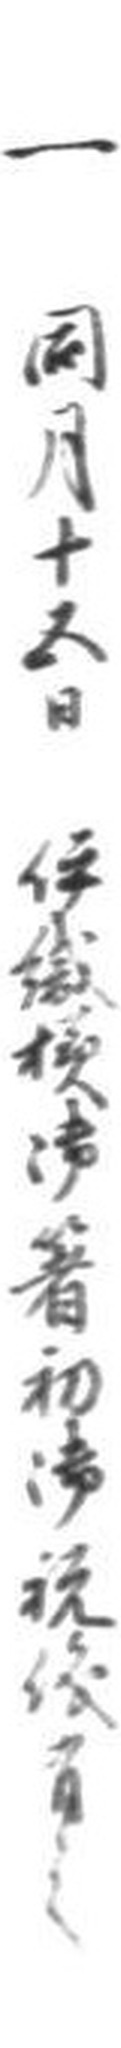一同月十五日伊織様御箸初御祝儀有之
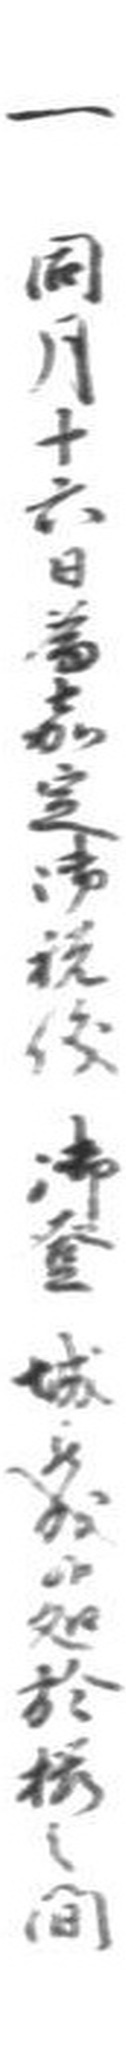一同月十六日為嘉定御祝儀御登城被成候処於桜之間
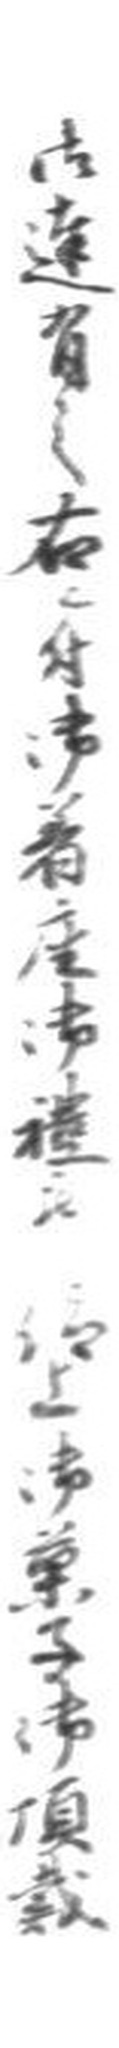御達有之右ニ付御着座御礼被仰上御菓子御頂戴

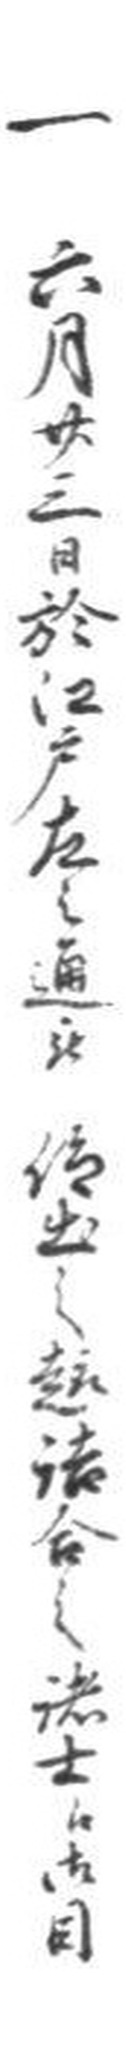一六月廿三日於江戸左之通被仰出之趣詰合之諸士江御目
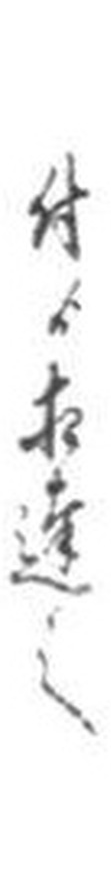付ゟ相達之
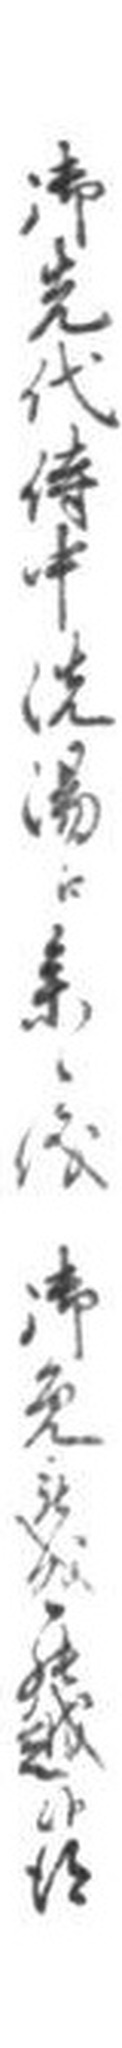御先代侍中洗湯江参候儀御免被成罷越候得
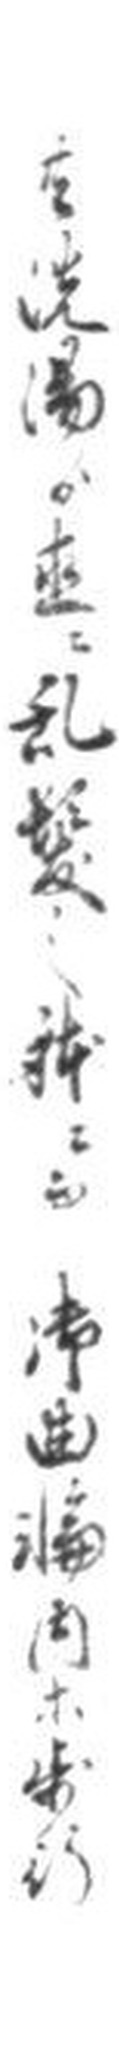共洗湯ゟ直ニ乱髪之体ニ而御曲輪内等歩行
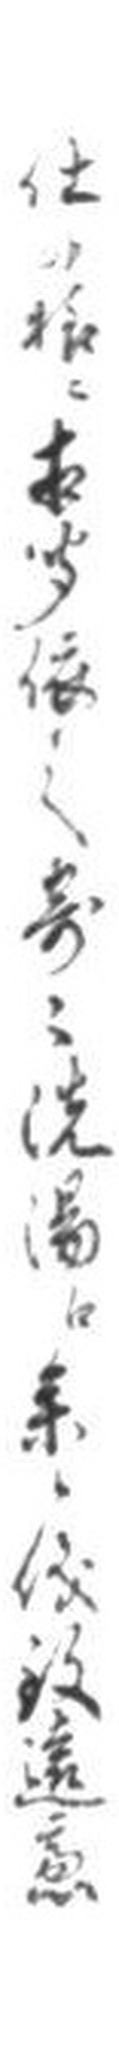仕候様ニ相聞依之寄々洗湯江参候儀致遠慮
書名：家譜 三十五 宗昌公 従享保六年到同七年
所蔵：福井県文書館 Fukui Prefectural Archives
